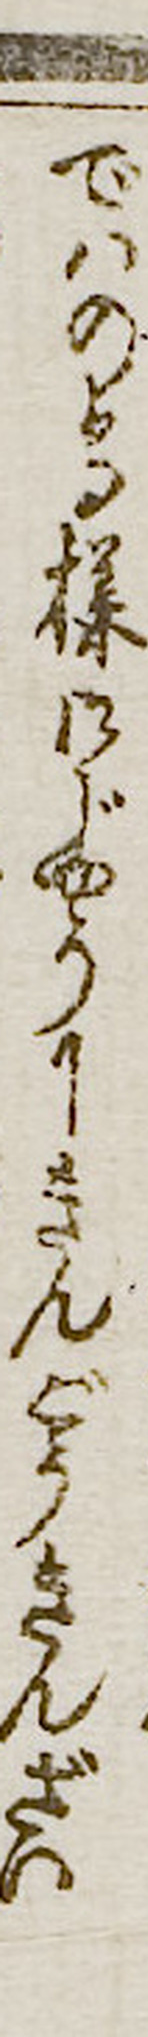ではの守様御じやう下きんごうきんざい
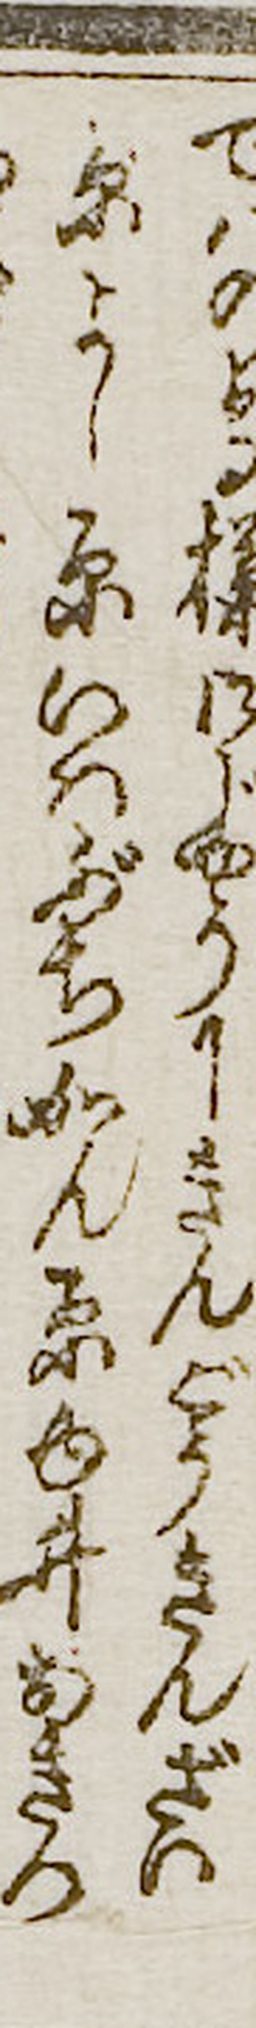原よし原いわぶちかん原ゆ井おきつ
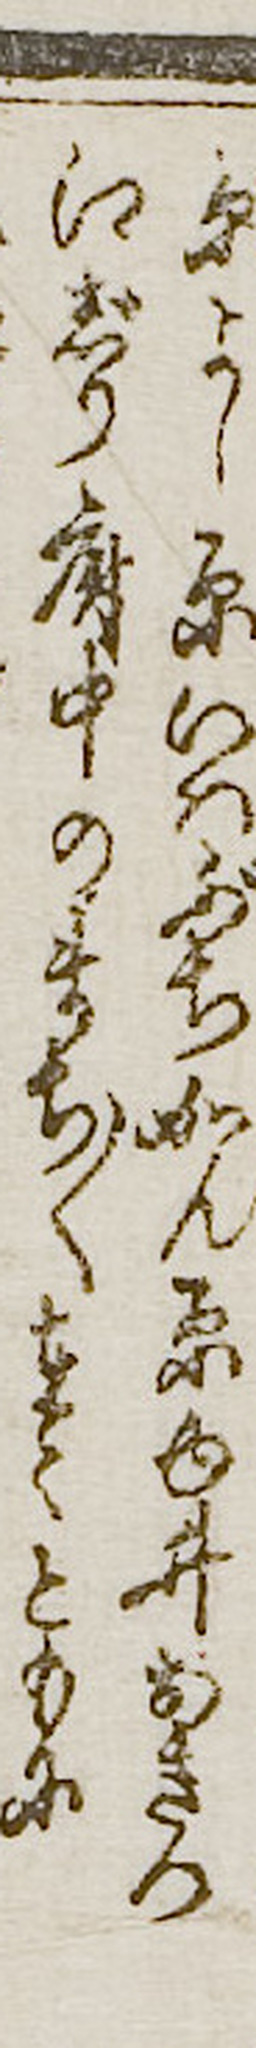江じり府中のまち〳〵在〻ともに
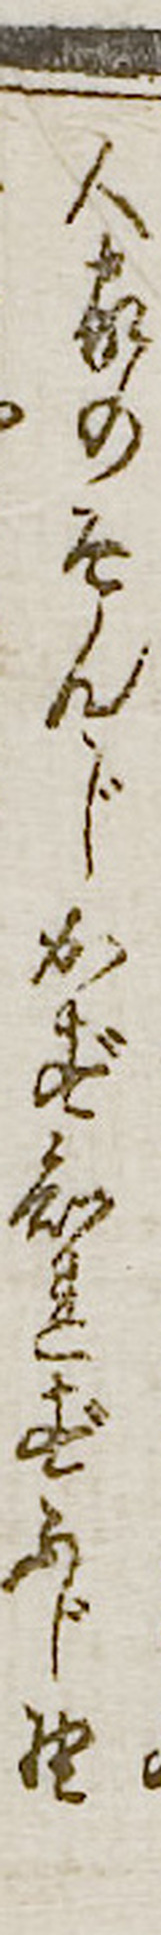人家のそんじかずしれずふじ野
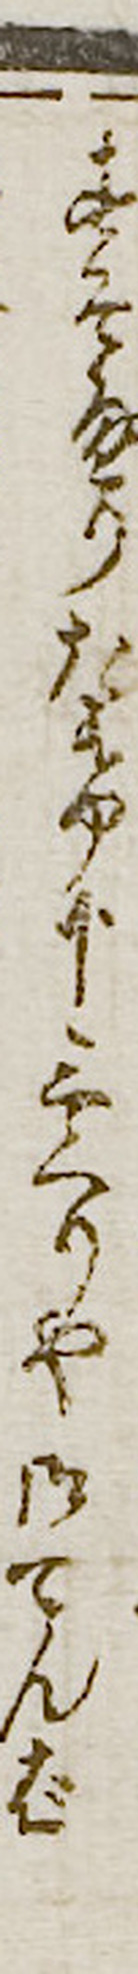すそ通りたもゆ下御くりや御てんば
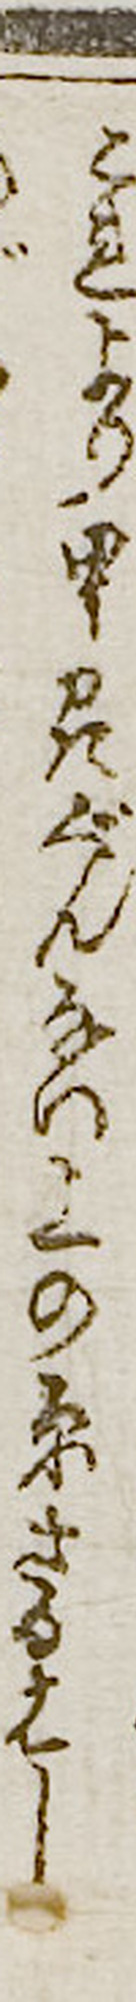これより甲州ぐんない上の原さるはし
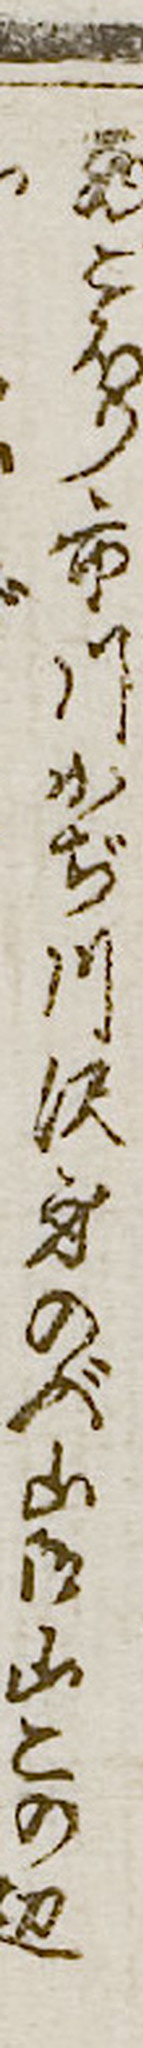西ごほり市川かぢ川沢身のぶ山御山この辺
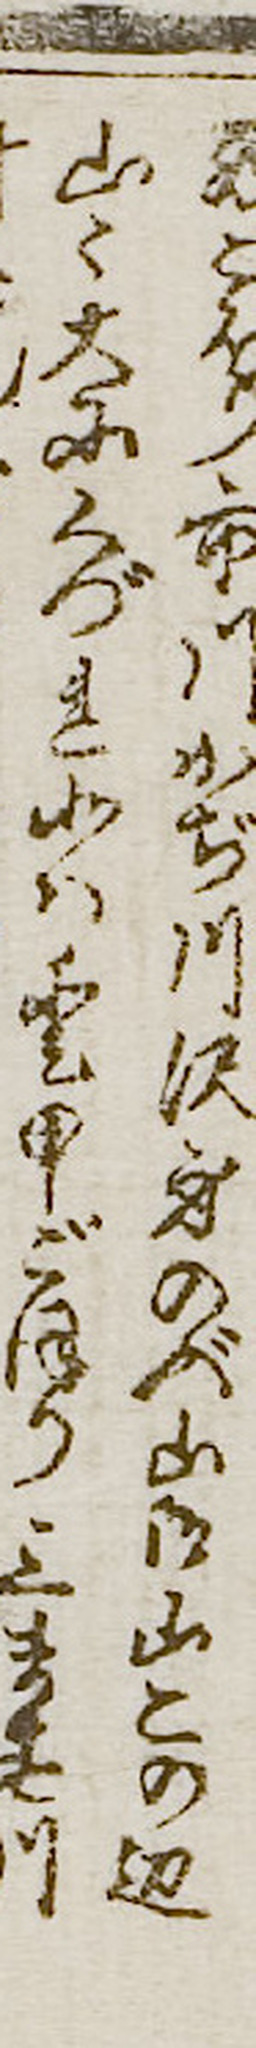山〻大にくづれ北は愛甲ごほり三ます川
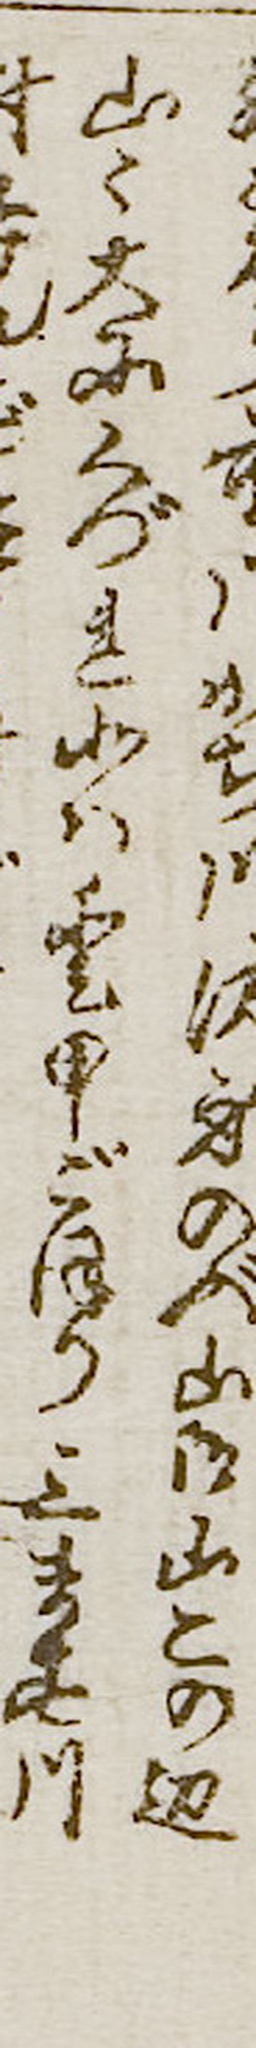山〻大にくづれ北は愛甲ごほり三ます川
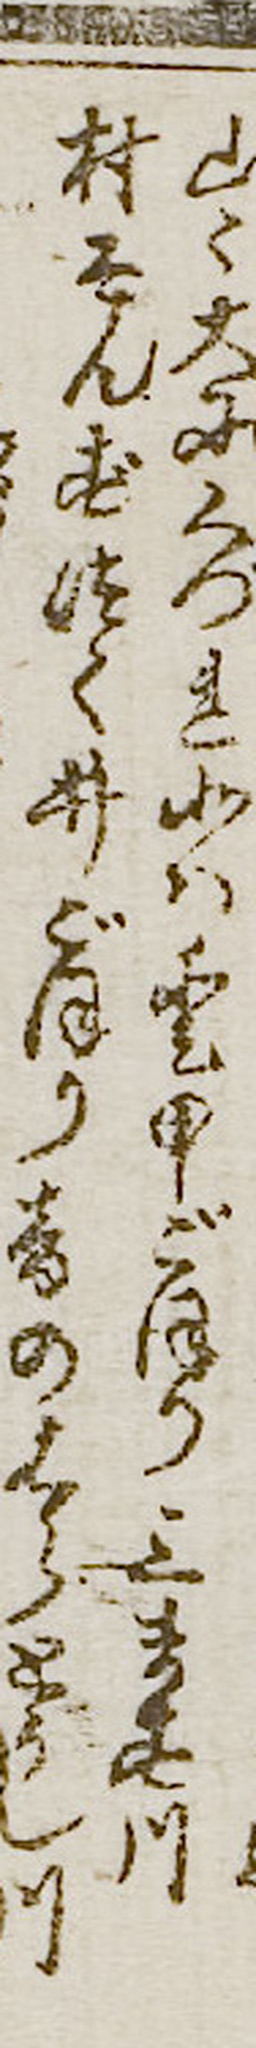村そんずつく井ごほり音のはらとうし川
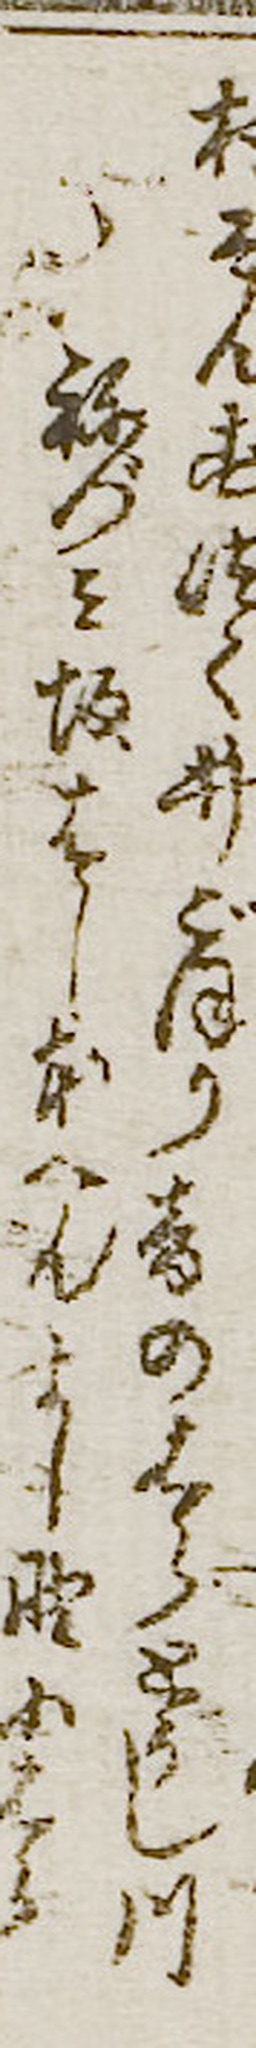ねづみ坂はし本へんよし野小はら
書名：伊豆下田小田原箱根大地震之図
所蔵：東京大学総合図書館 General Library in the University of Tokyo, JAPAN
